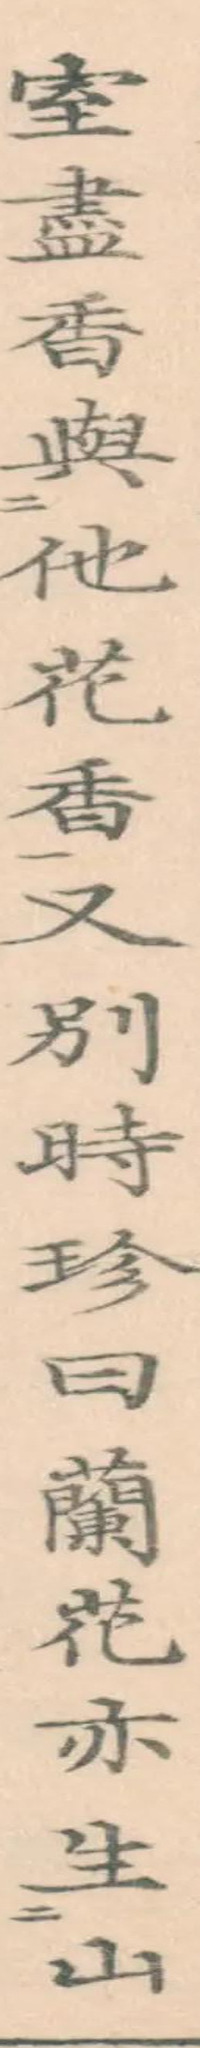室盡香與他花香又別時珍曰蘭花亦生山
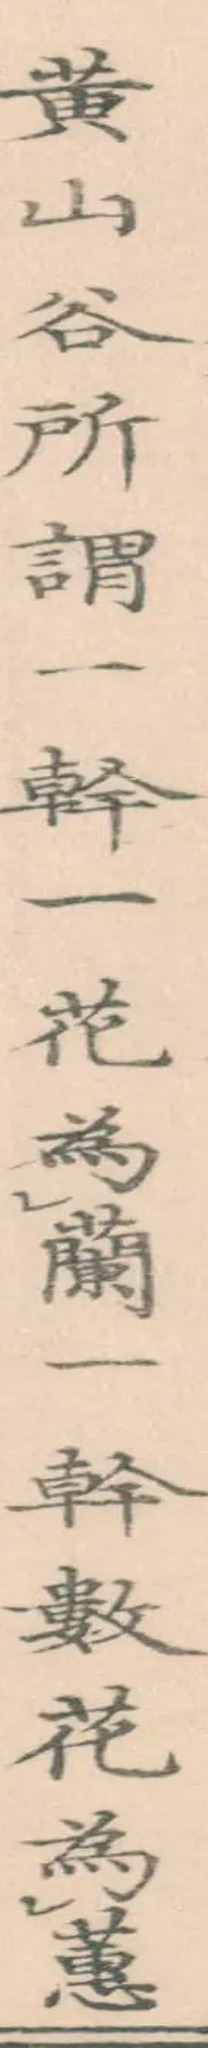黄山谷所謂一幹一花為蘭一幹数花為蕙
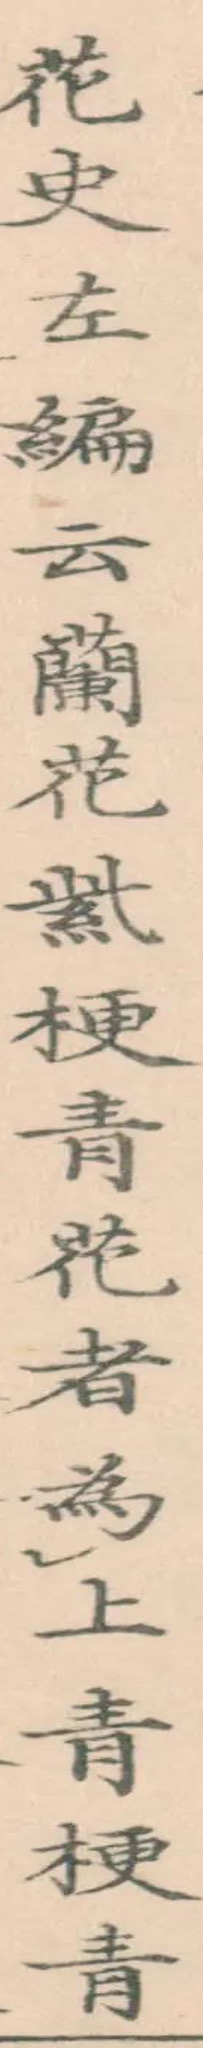花史左編云蘭花紫梗青花者為上青梗青
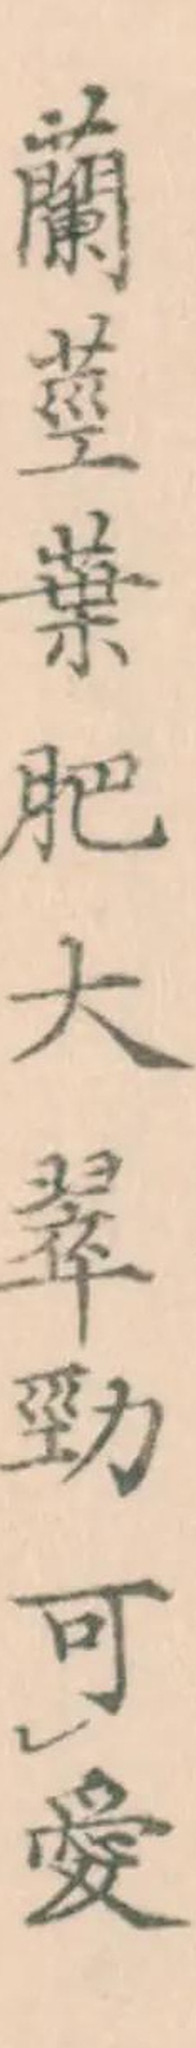蘭莖葉肥大翠勁可愛
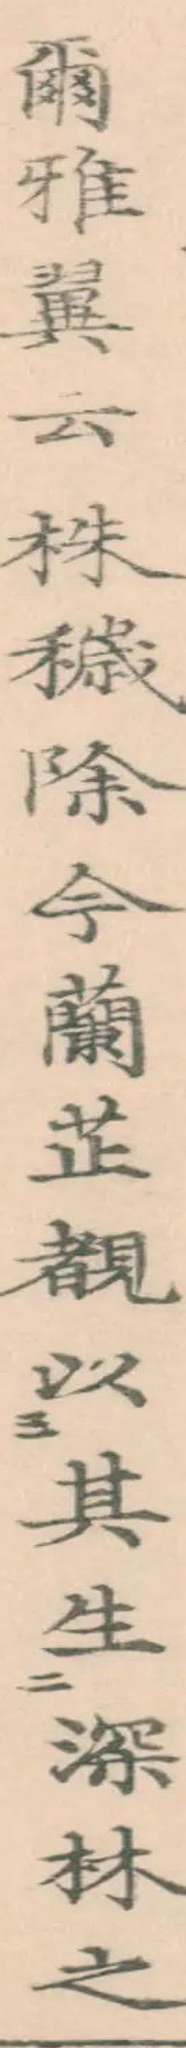爾雅翼云株穢除今蘭芷覩以其生深林之
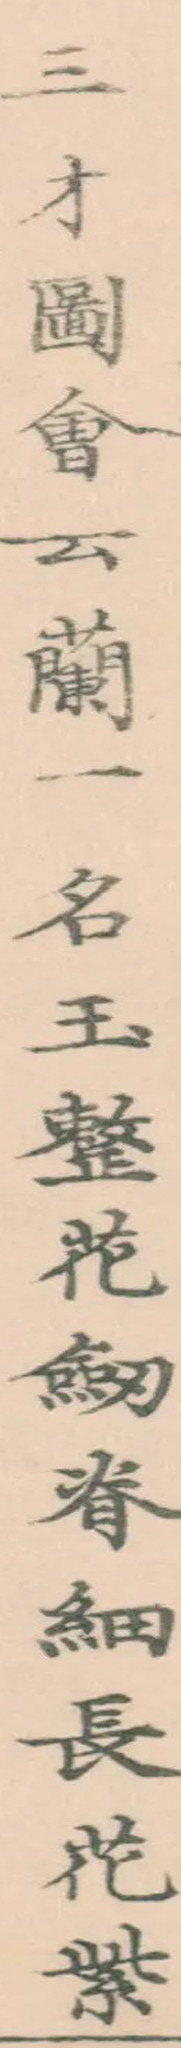三才圖會云蘭一名玉整花剱脊細長花紫
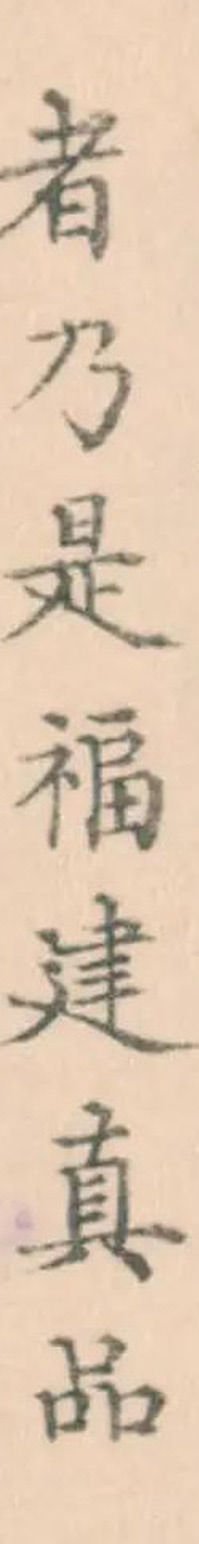者乃是福建真品
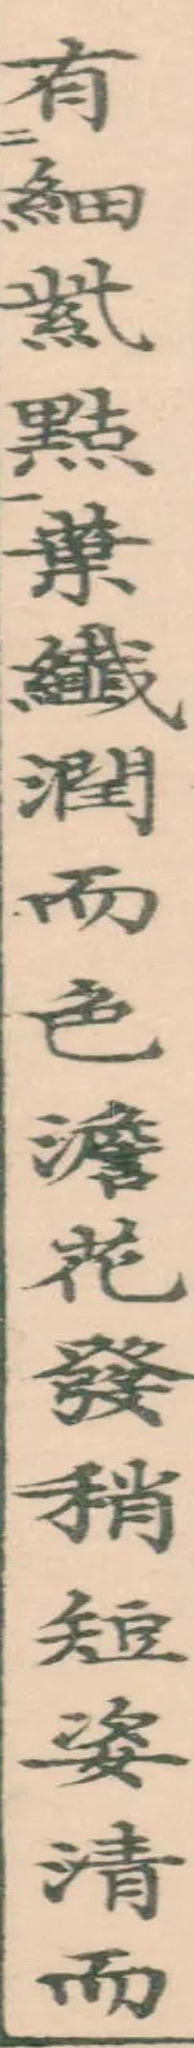有細紫点葉繊潤而色澹花発稍短姿清而
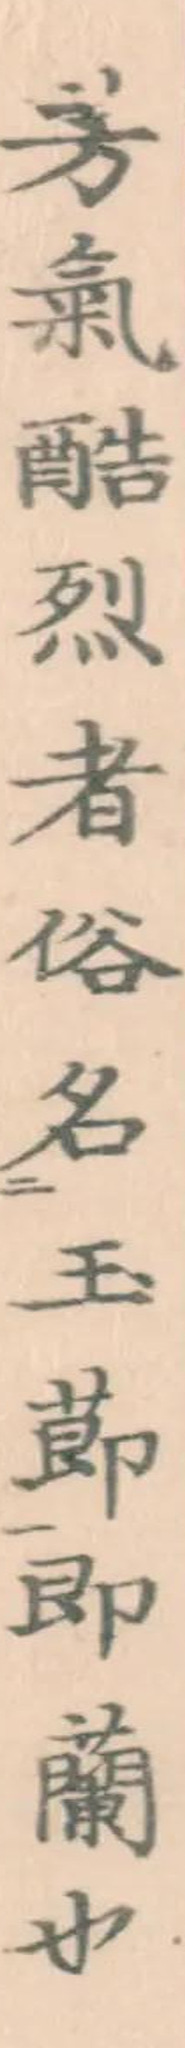芳気酷烈者俗名玉節即蘭也
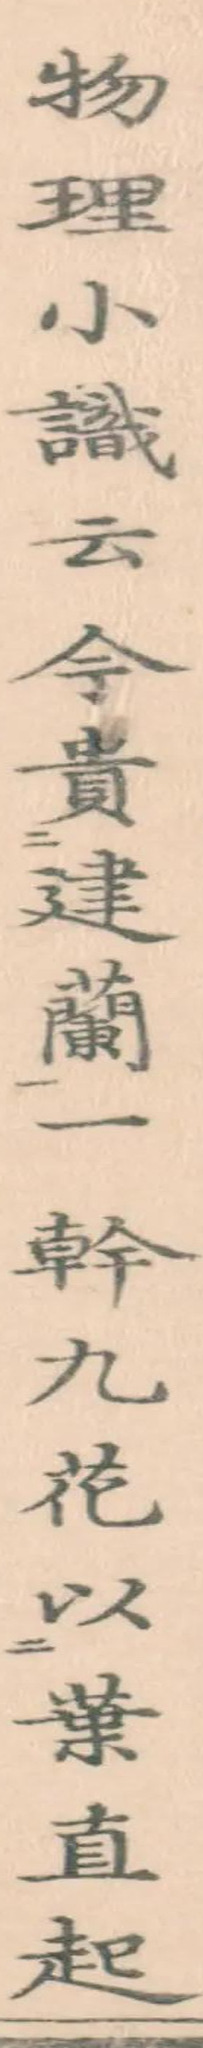物理小識云今貴建蘭一幹九花以葉直起
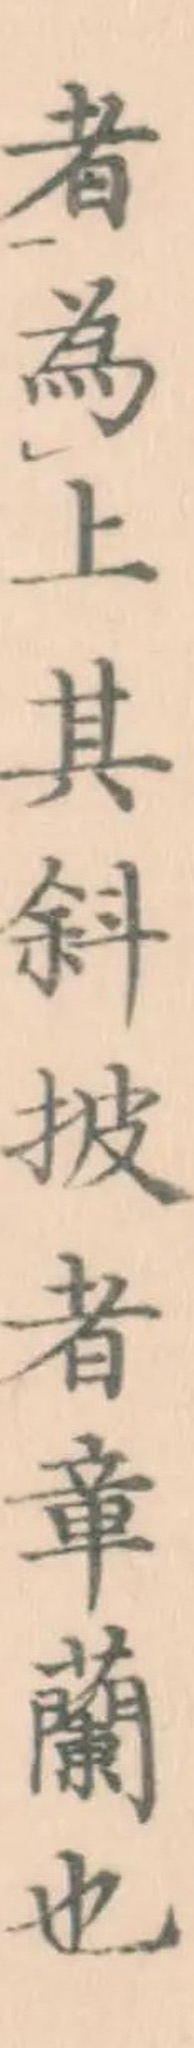者為上其斜披者章蘭也
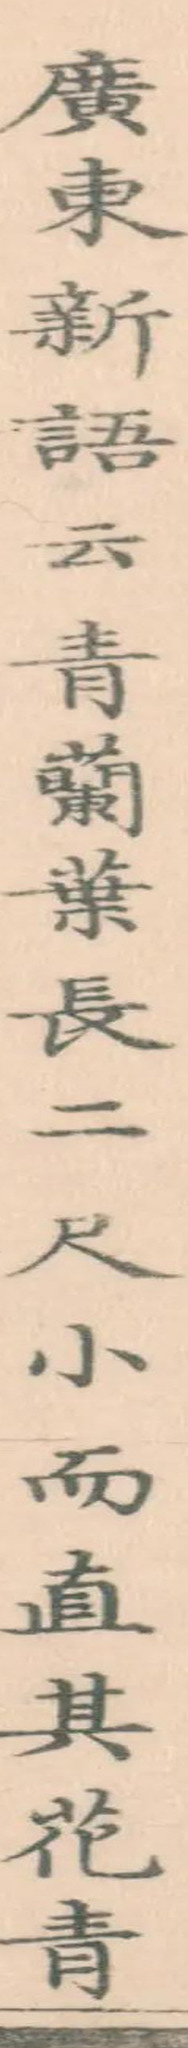広東新語云青蘭葉長二尺小而直其花青
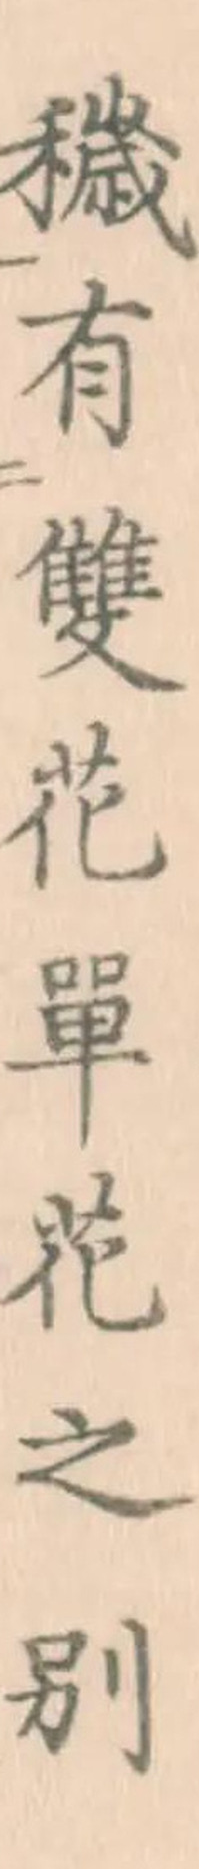穢有雙花単花之別
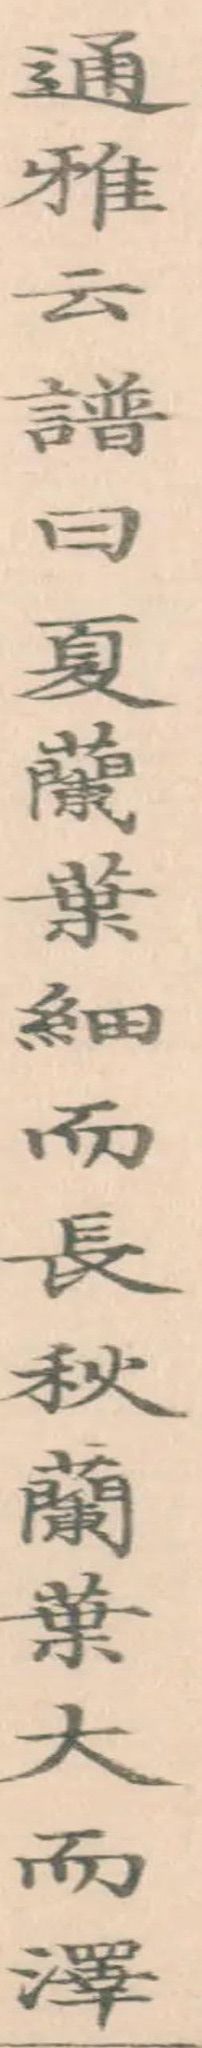通雅云譜曰夏蘭葉細而長秋蘭葉大而澤
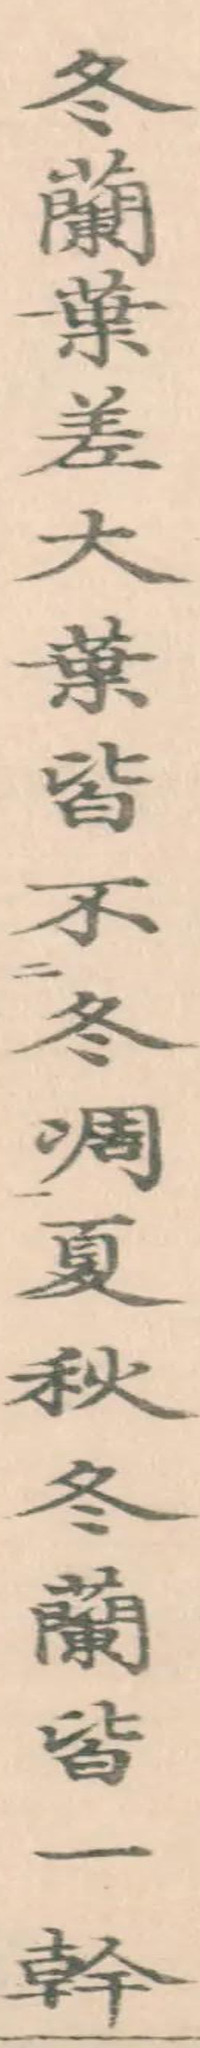冬蘭葉差大葉皆不冬凋夏秋冬蘭皆一幹
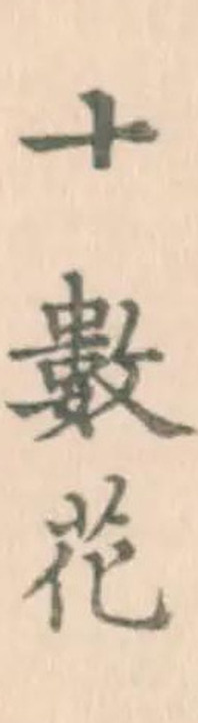十数花
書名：草木性譜 3巻. [2]
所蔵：国立国会図書館 National Diet Library, JAPAN
